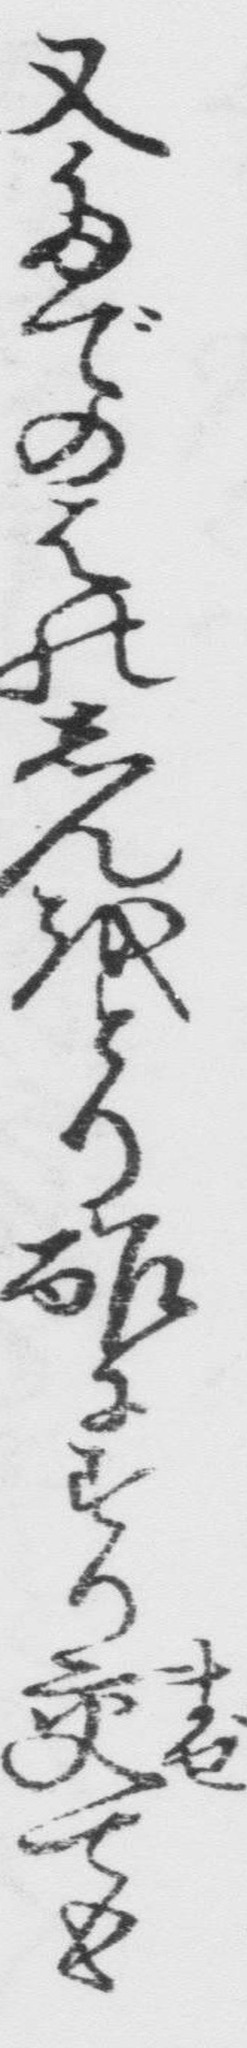又たでのはのしんをとりすり交ても
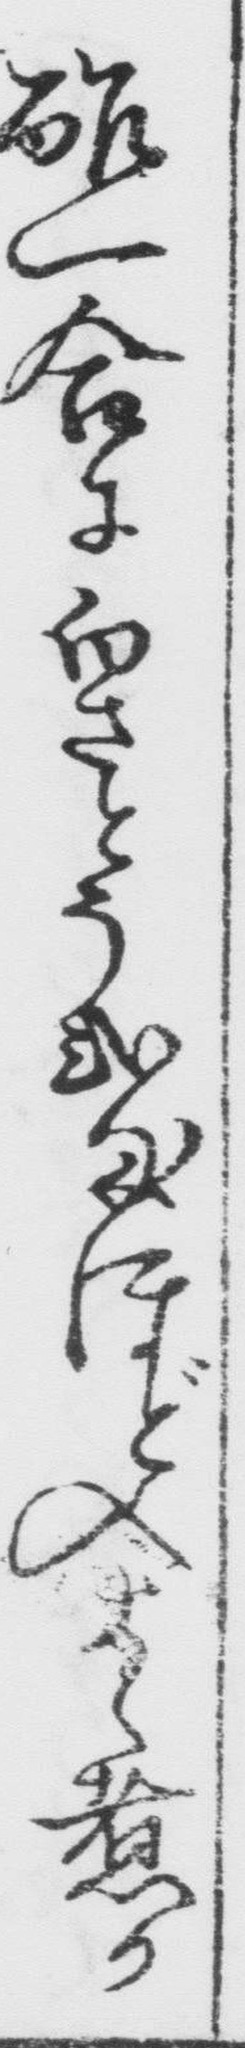酢一合に白さとう弐匁ほど入よく煮か
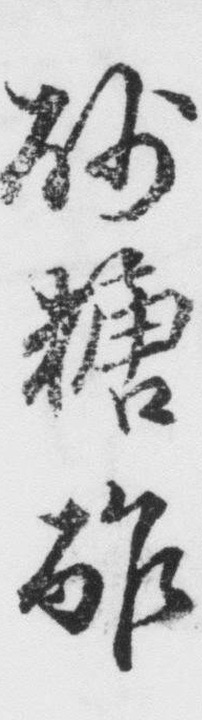砂糖酢
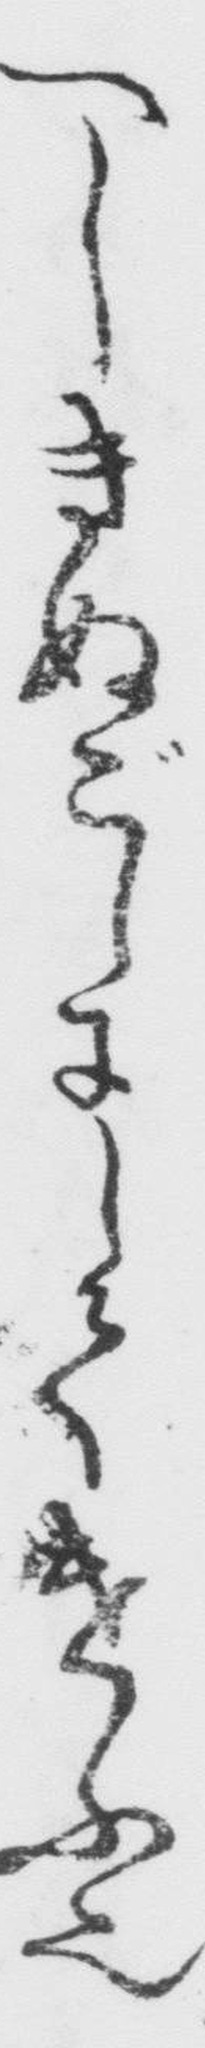へしきぬごしにして遣ふ也
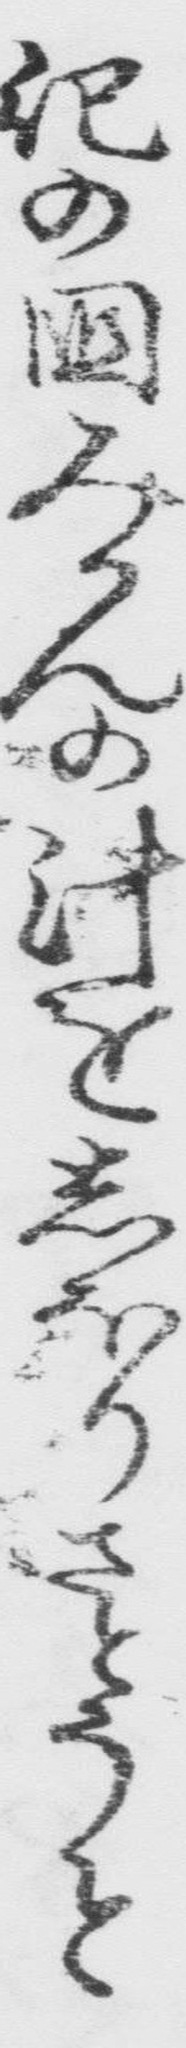紀の国みかんの汁をしほりさとうと
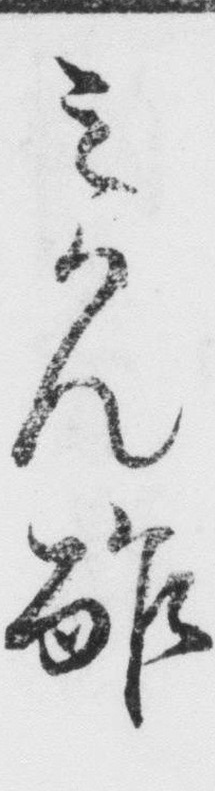みかん酢
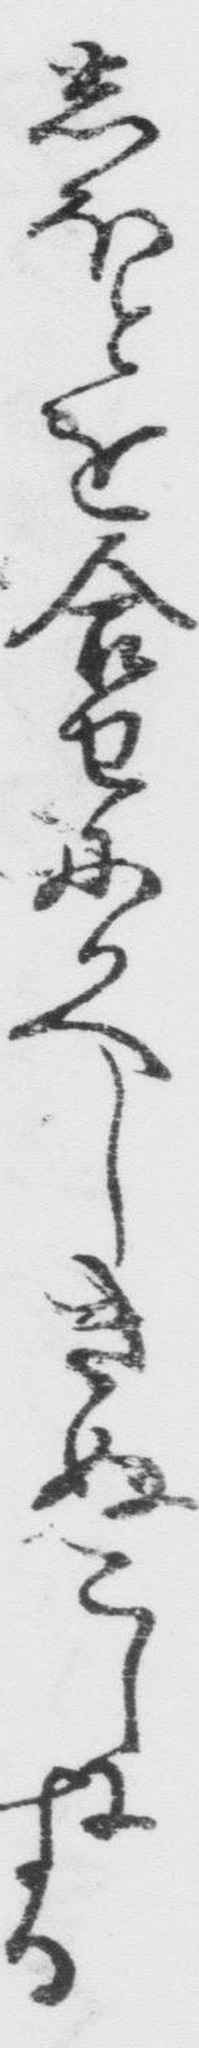しほとを合せにかへしきぬこしにする
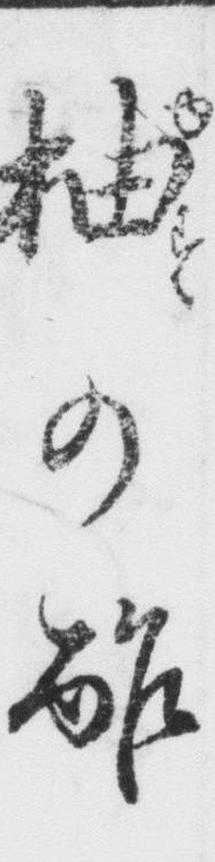柚の酢
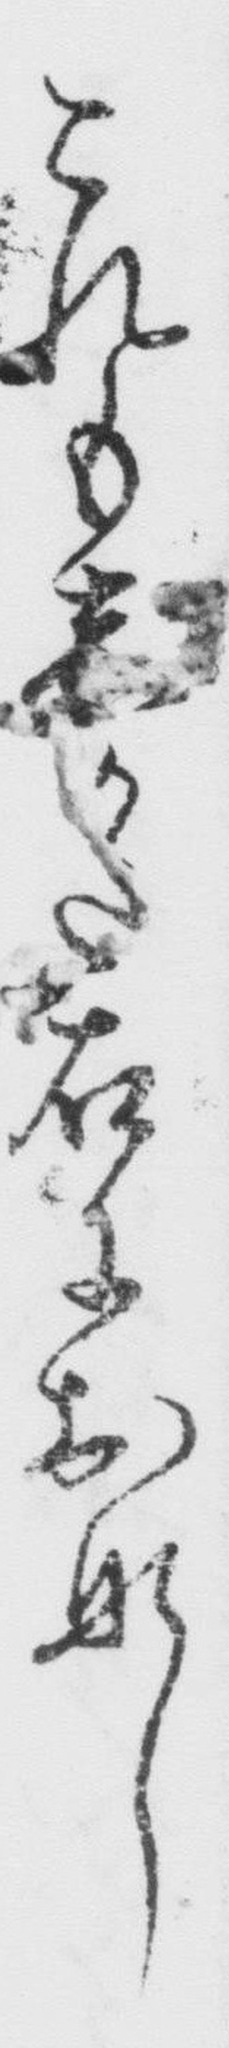これもしかた右におなじ
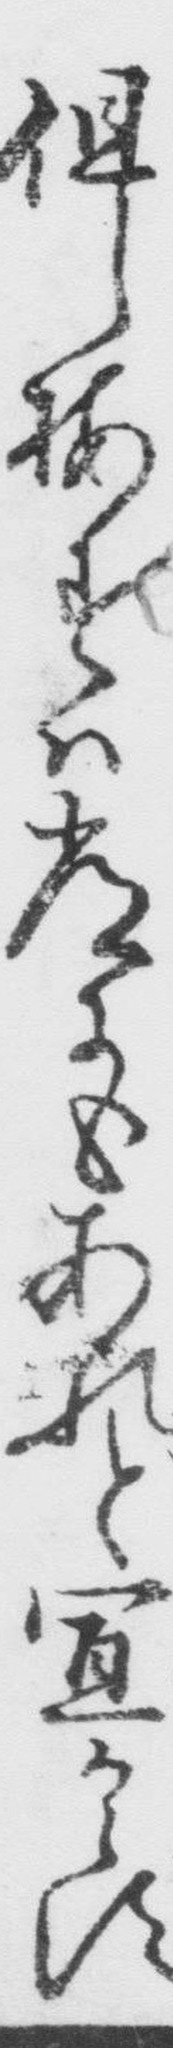但し梅ずは常にもあれと宜しからず
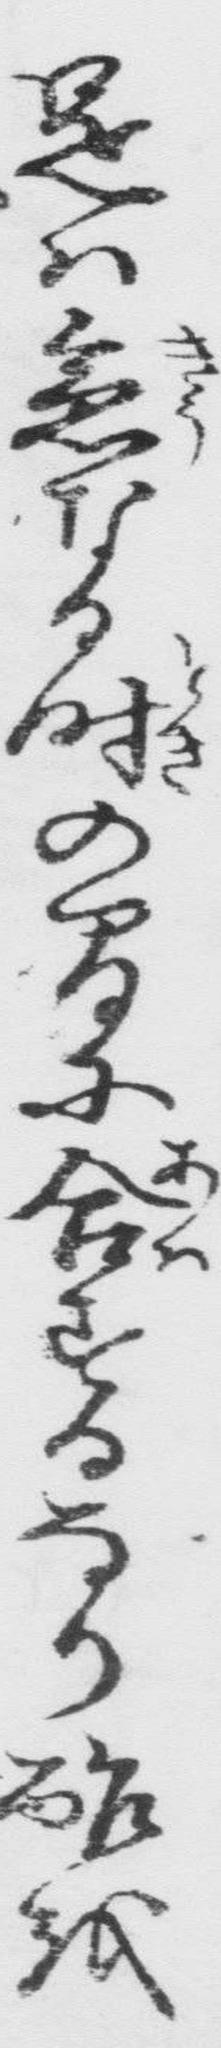是は急なる時の間に合するなり酢を
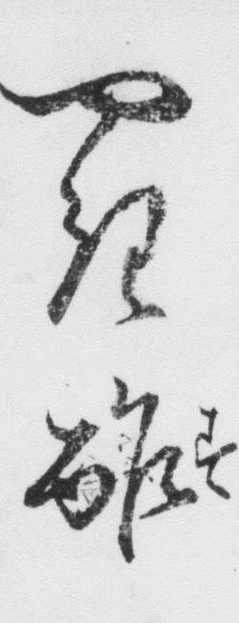やき酢
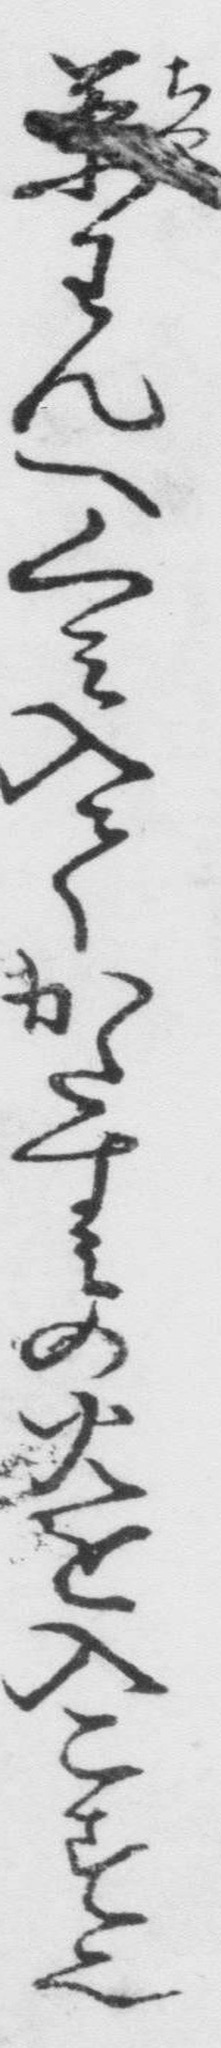茶わんへくみ入てかたすみの火を入てこす也

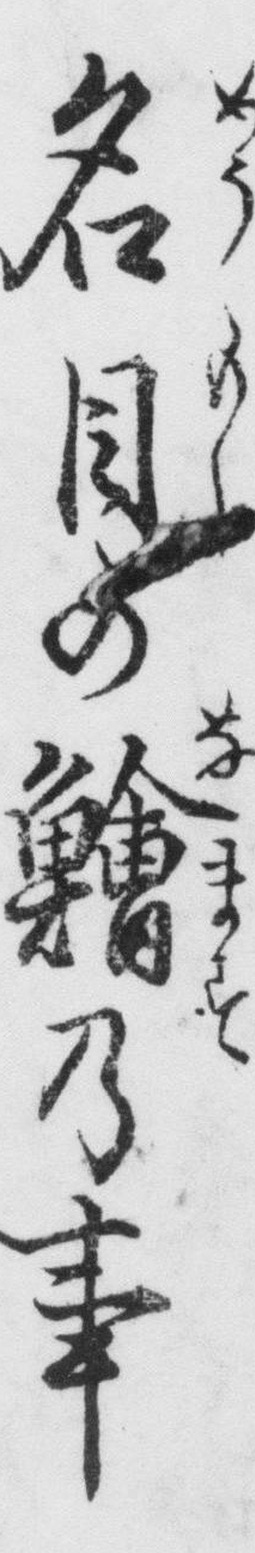名目の鱠の事
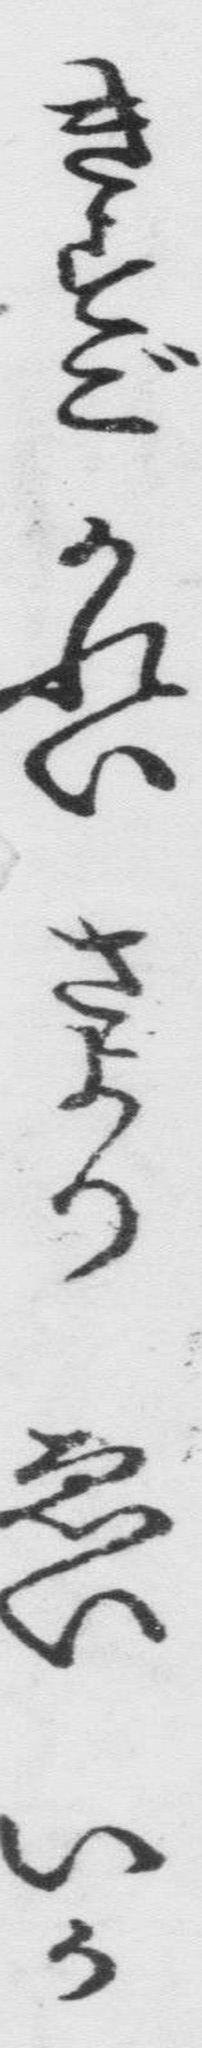きすごかれいさよりゑいいか
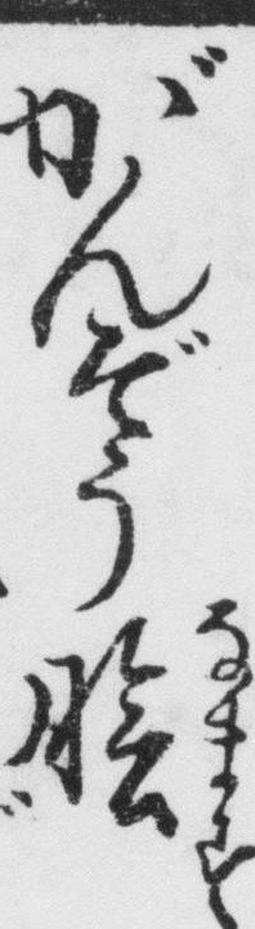がんぞう鱠
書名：料理早指南
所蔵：大阪府立大学学術情報センター 国文学研究資料館
